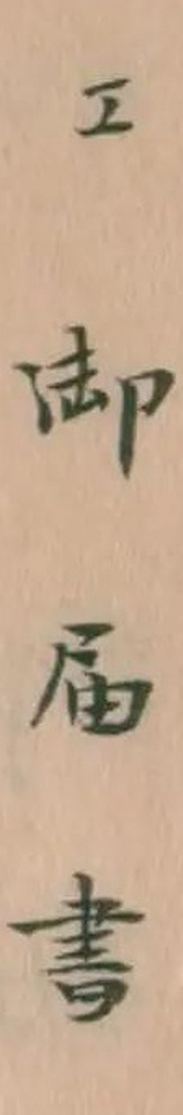エ御届書
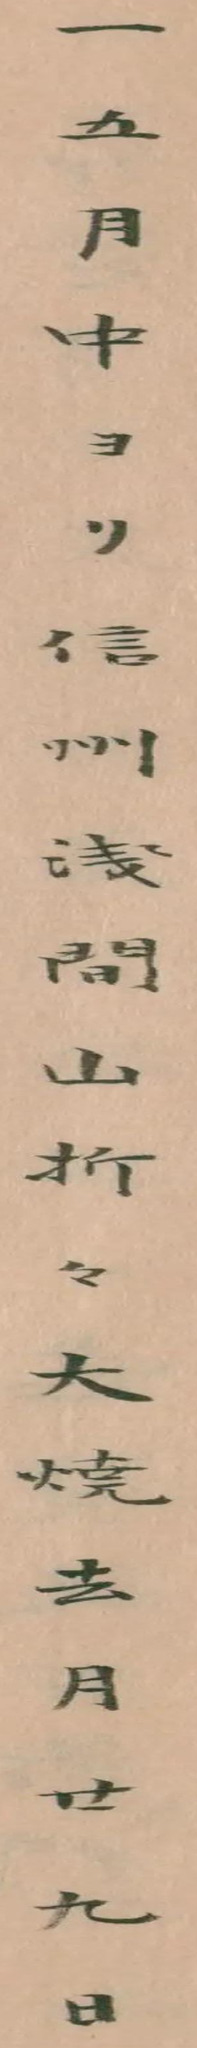一五月中ヨリ信州浅間山折々大焼去月廿九日
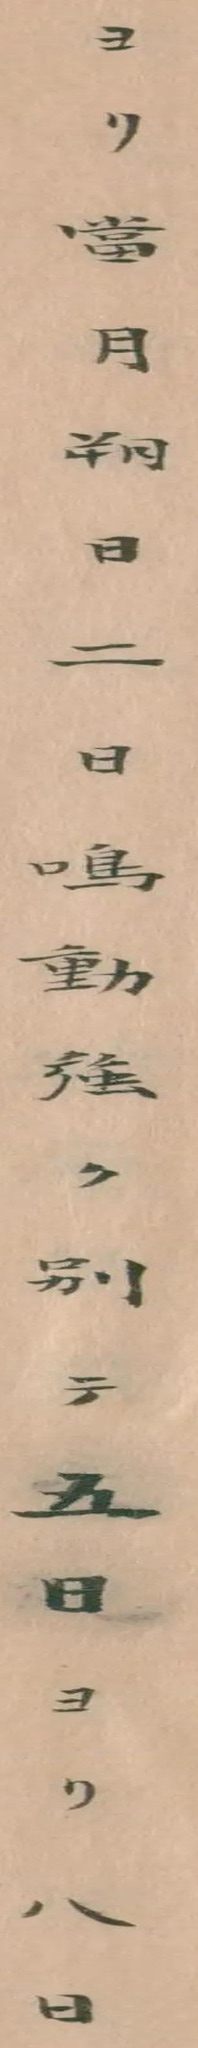ヨリ当月朔日二日鳴動強く別テ五日ヨリ八日
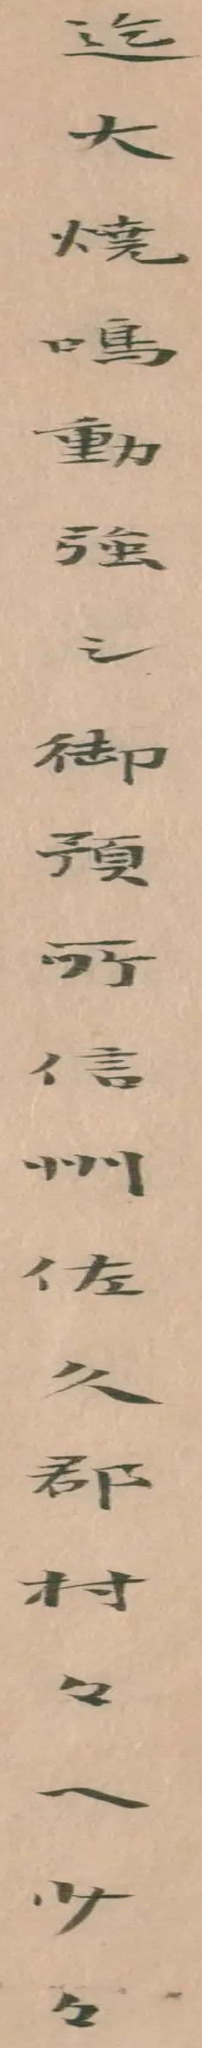迄大焼鳴動強シ御預所信州佐久郡村々へ少々
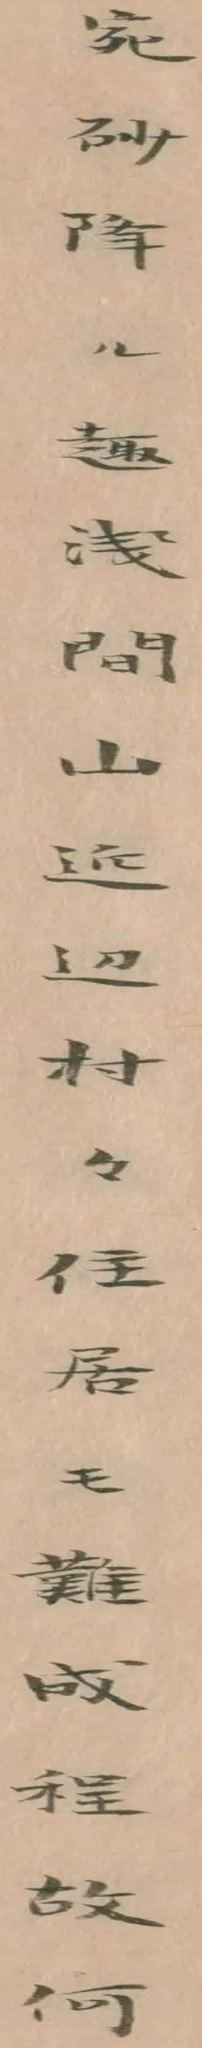宛砂降ㇽ趣浅間山近辺村々住居モ難成程故何
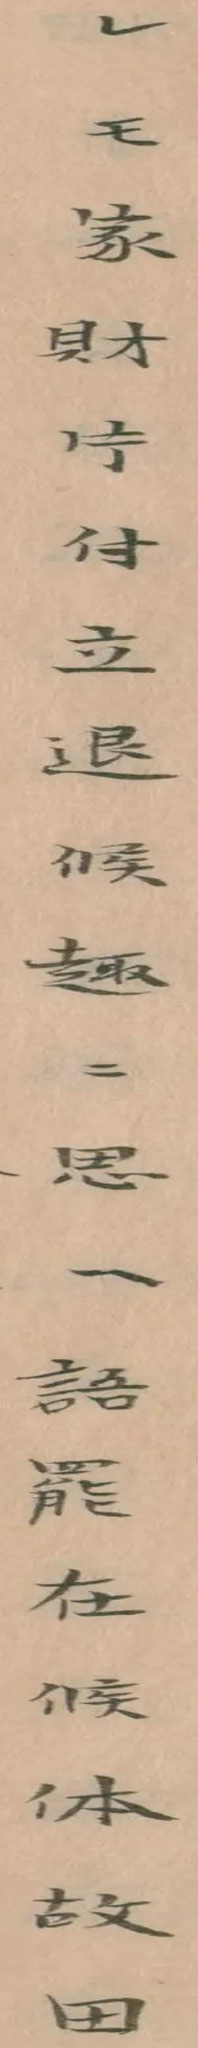レモ家財片付立退候趣二思へ語罷在候体故田

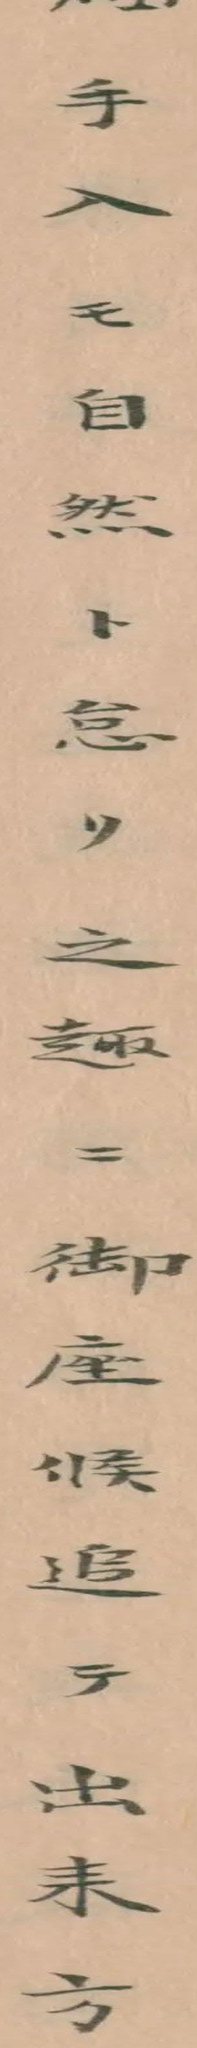畑手入モ自然ト怠り之趣二御座候追テ出来方
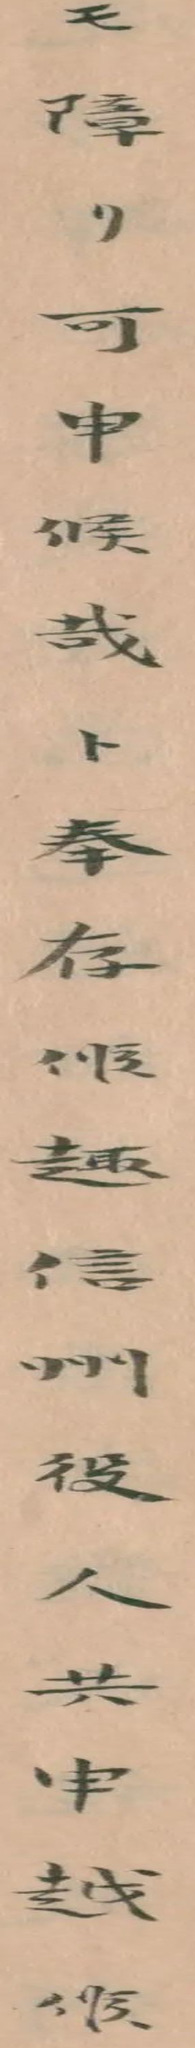モ障り可申候哉ト奉存候趣信州役人共申越候
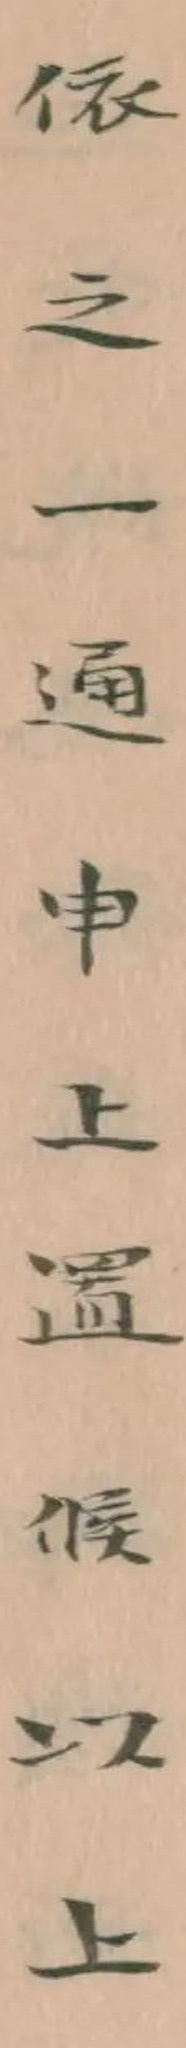依之一通申上置候以上
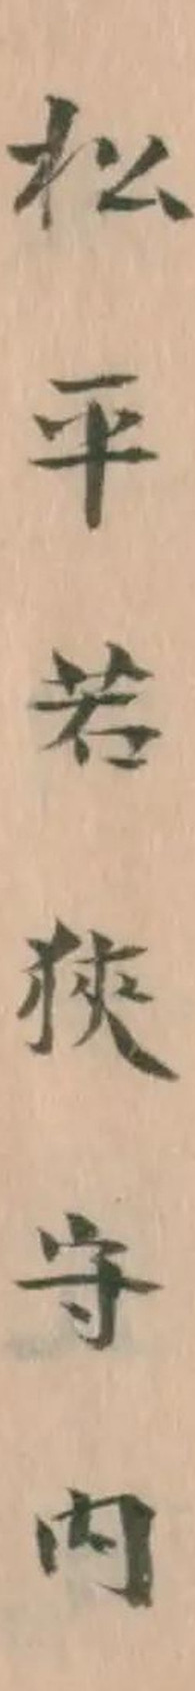松平若狭守内
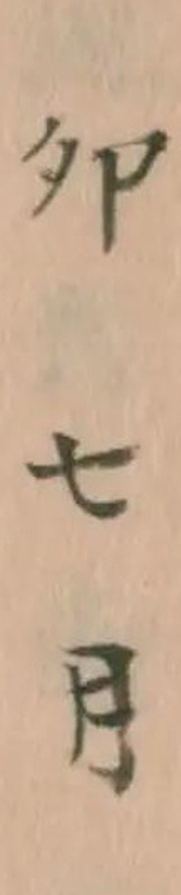卯七月
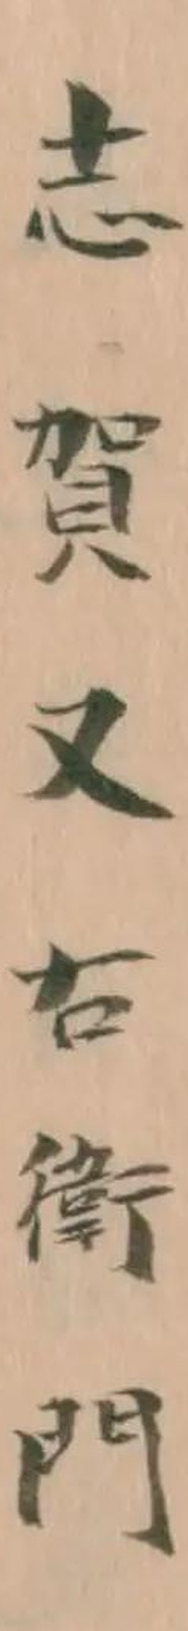志賀又右衛門
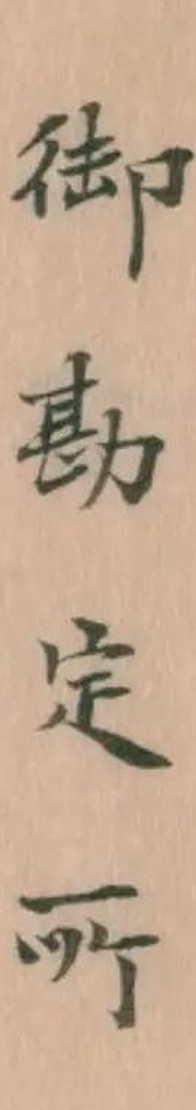御勘定所
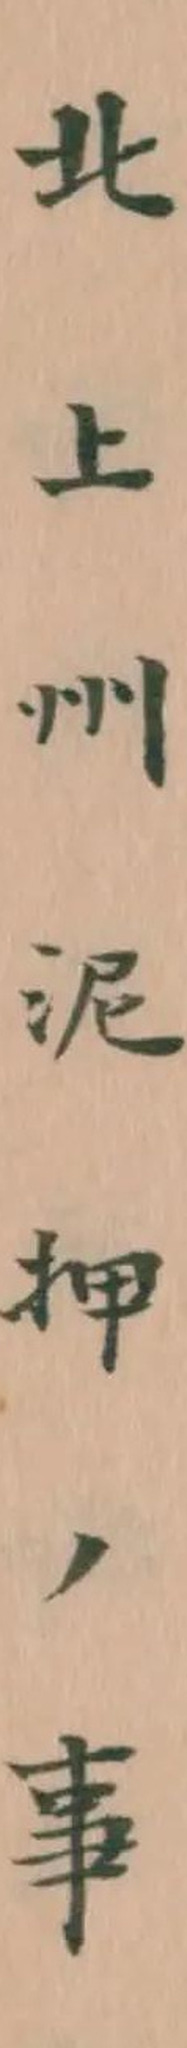北上州泥押ノ事
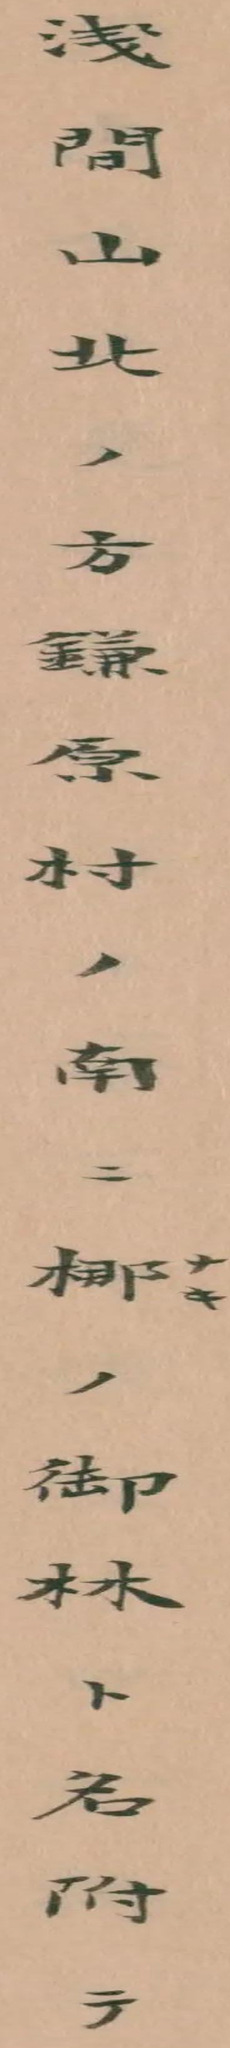浅間山北ノ方鎌原村ノ南二梛ノ御林ト名附テ
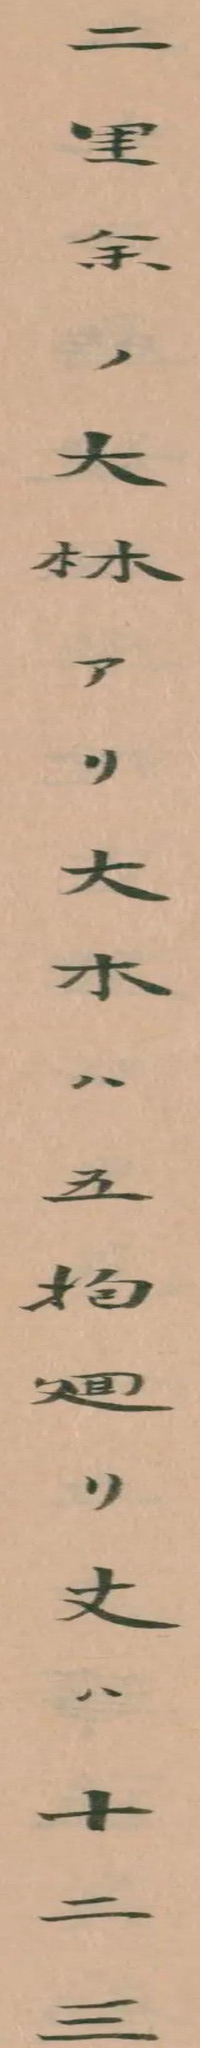二里余ノ大林アリ大木ハ五抱廻り丈ハ十二三
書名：地災撮要. 巻3(地震之部)-巻4(噴火之部)
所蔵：国立国会図書館 National Diet Library, JAPAN
